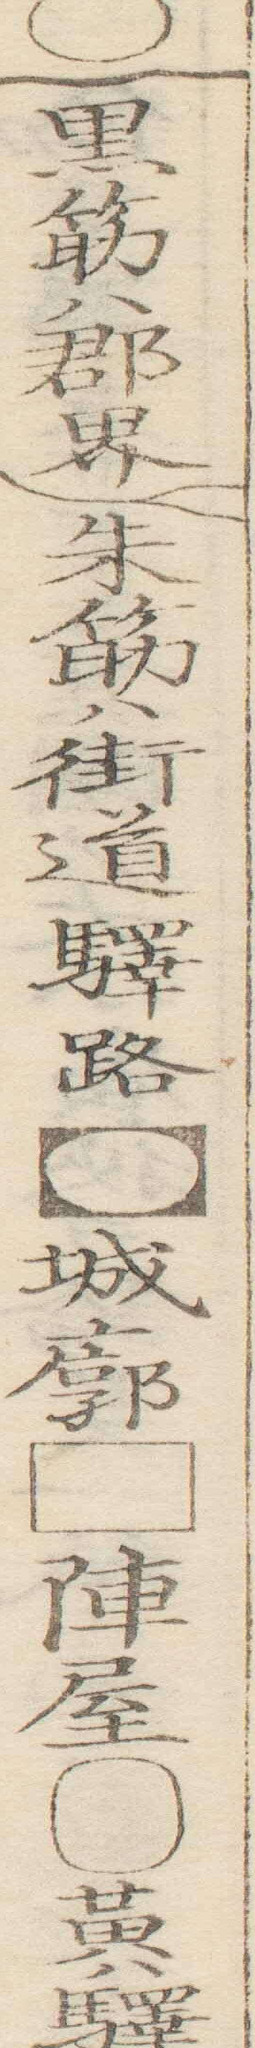○黒筋ハ郡界朱筋ハ街道駅路城廓陣屋黄ハ駅
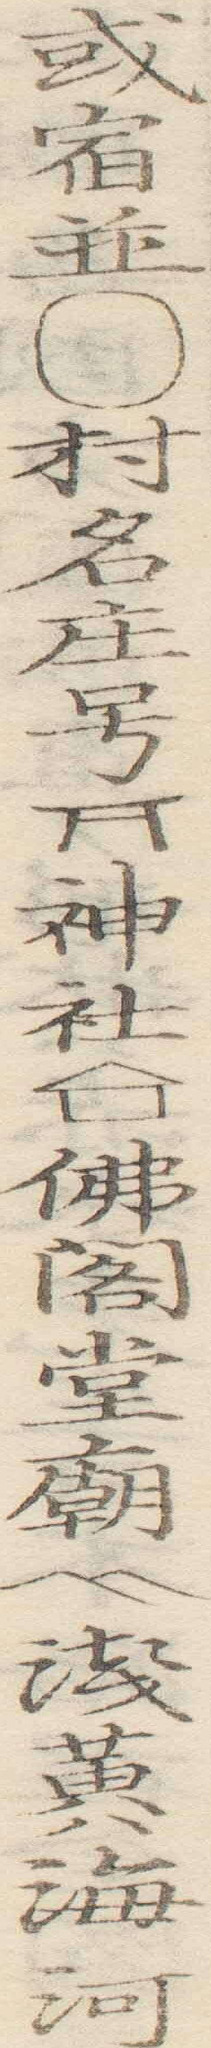或宿並村名庄号神社仏閣堂廟浅黄ハ海河
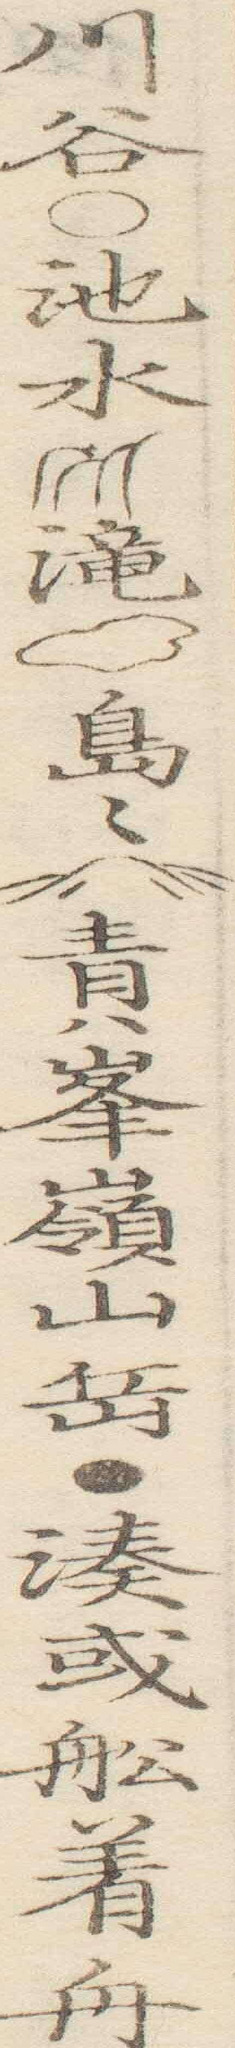川谷○池水滝島々青ハ峯嶺山岳●湊或船着舟
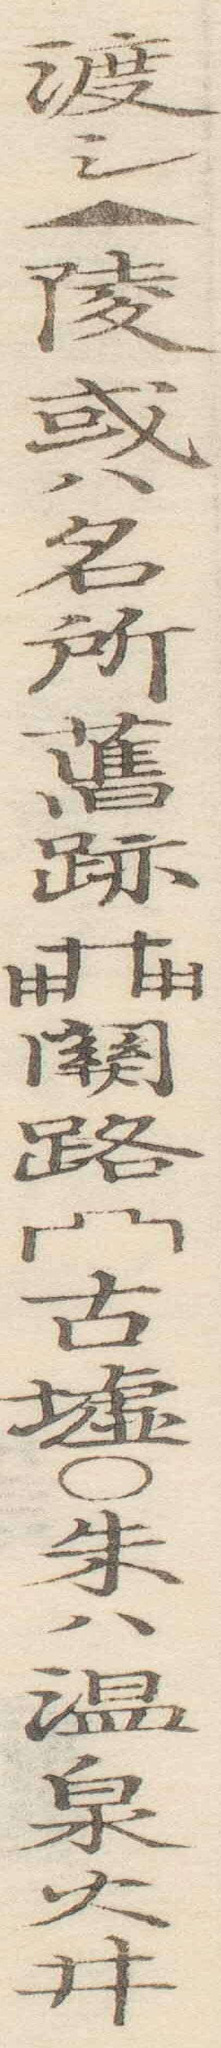渡シ▲陵或ハ名所旧跡関路古墟○朱ハ温泉火井
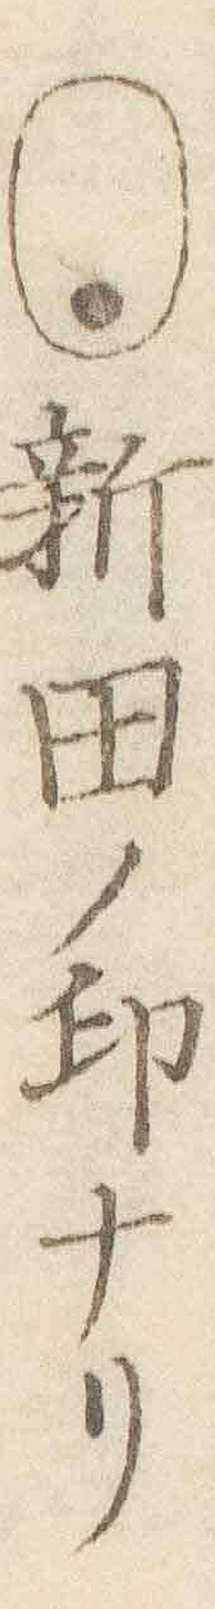新田ノ印ナリ
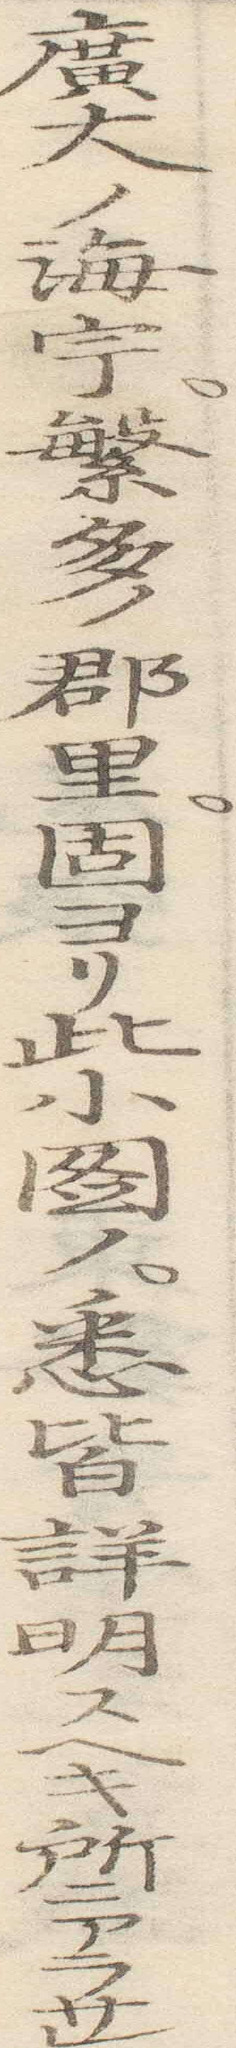広大ノ海宇、繁多ノ郡里、固ヨリ此小図ノ、悉皆詳明スヘキ所ニアラサレ
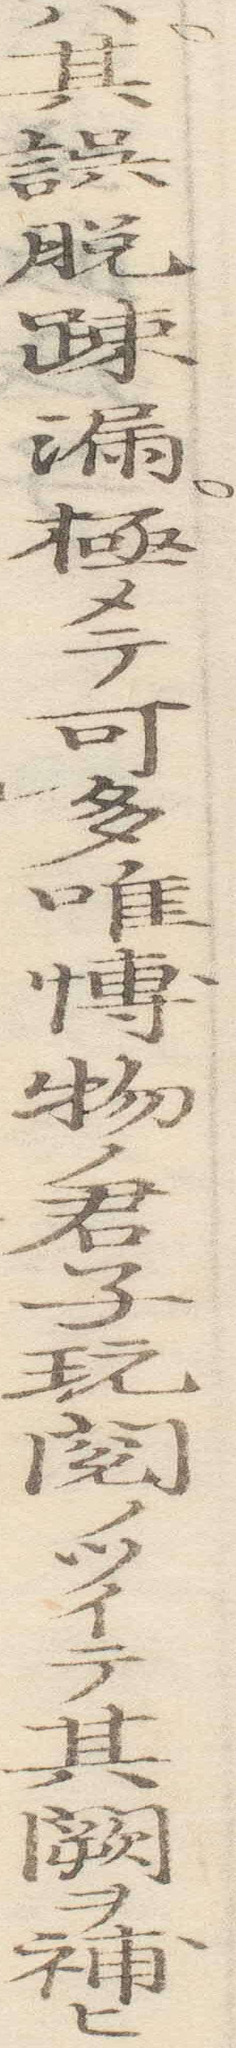ハ其誤脱疎漏、極メテ可多唯博物ノ君子玩閲ノツイテ其闕ヲ補ヒ
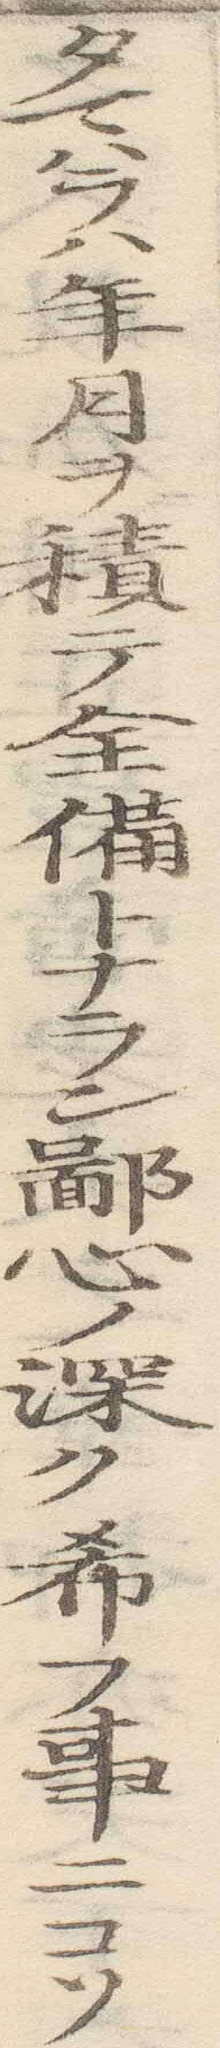タマハラハ年月ヲ積テ全備トナラン鄙心ノ深ク希フ事ニコソ
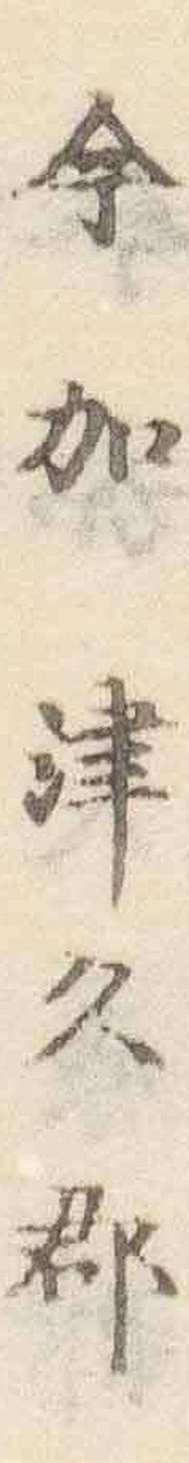今加津久郡
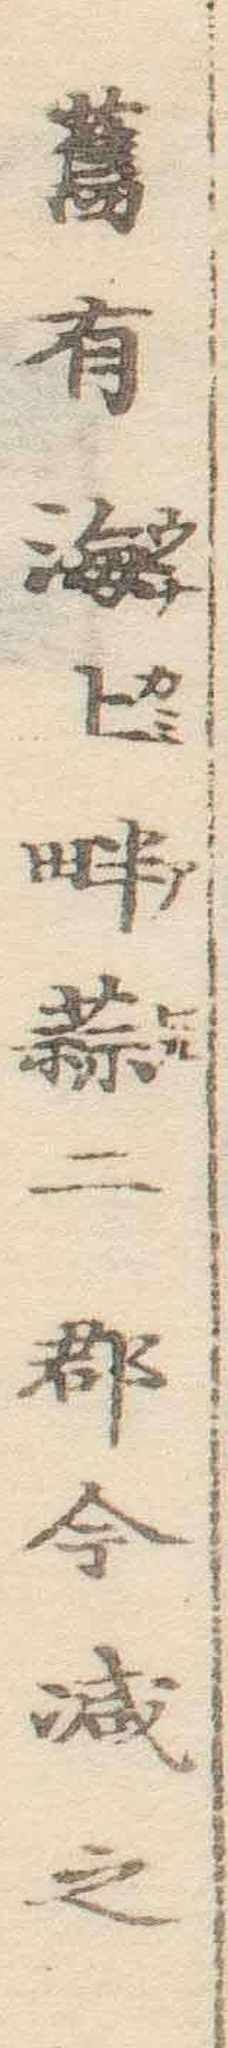旧有海上畔蒜二郡今減之

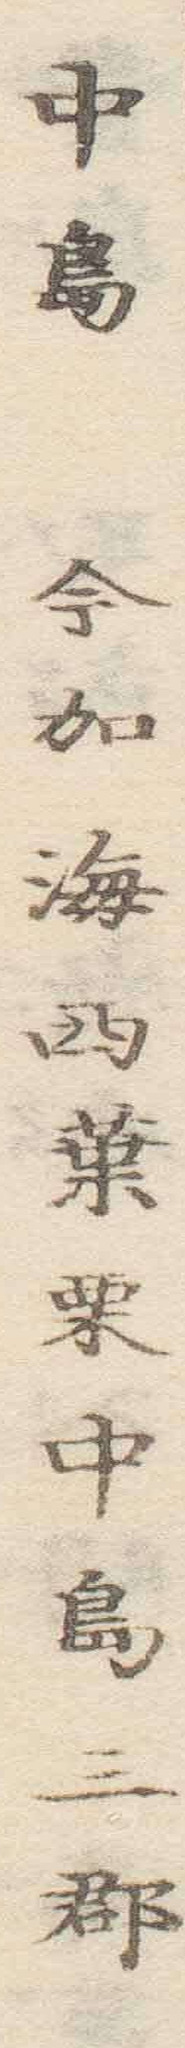中島今加海西葉栗中島三郡

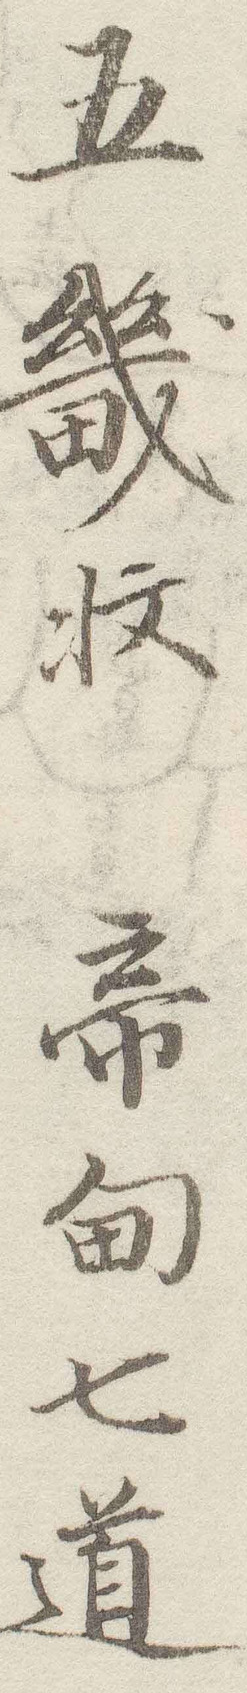五畿収帝甸七道
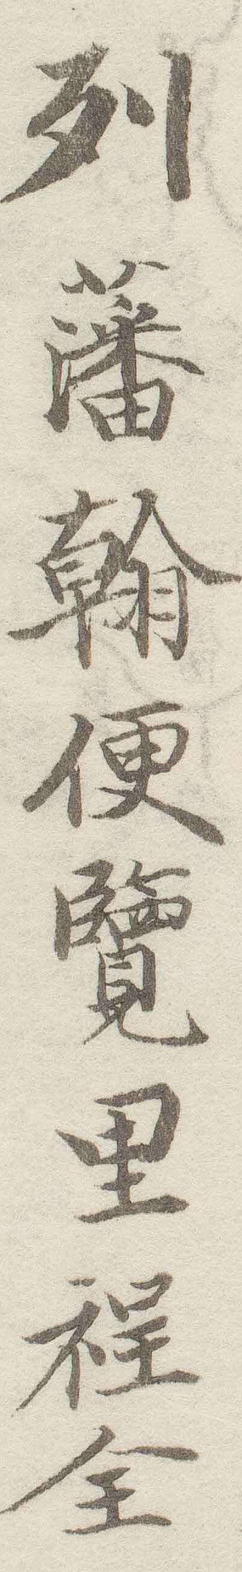列藩翰便覧里程全
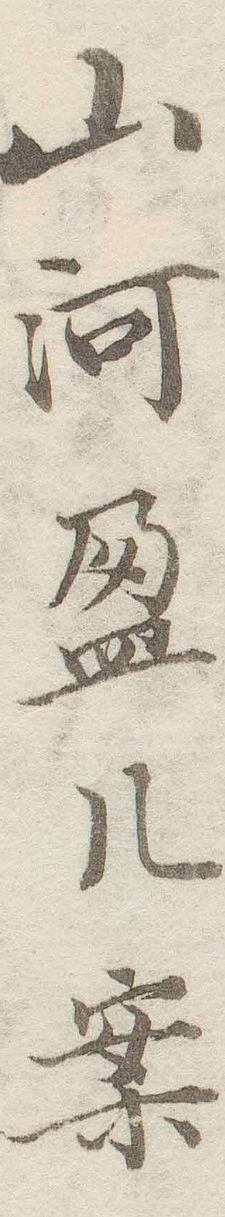山河盈几案

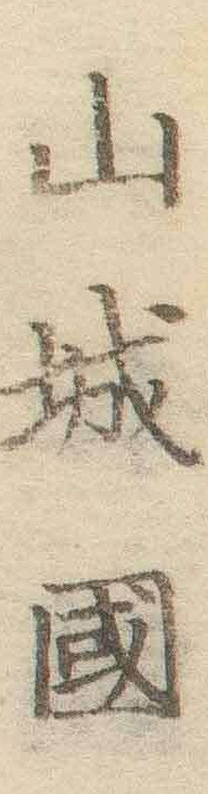山城国

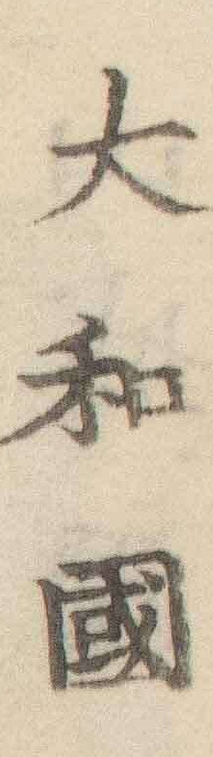大和国
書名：国郡全図
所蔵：東京学芸大学附属図書館 国文学研究資料館
